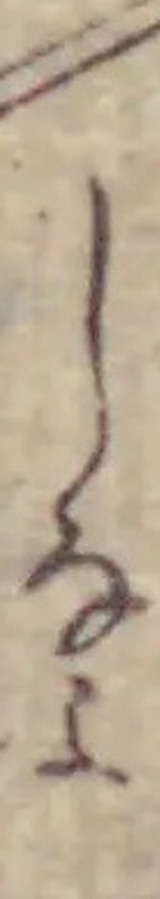しなよ
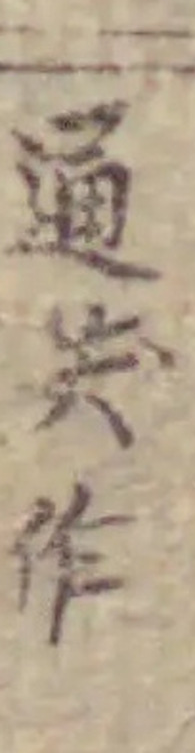通笑作
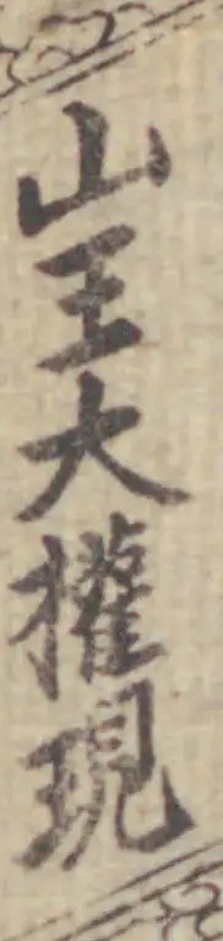山王大権現
